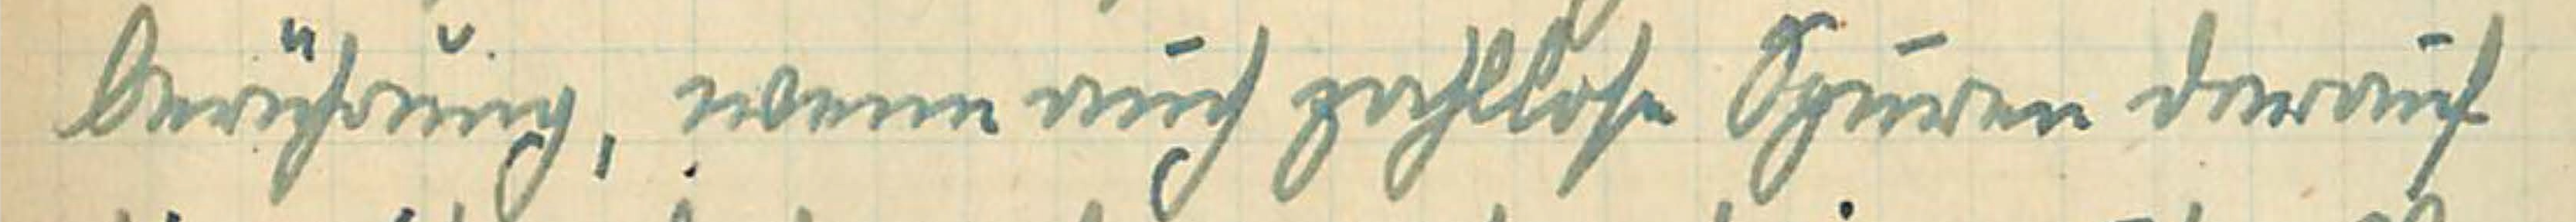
berührung, wenn auch zahllose Spuren darauf
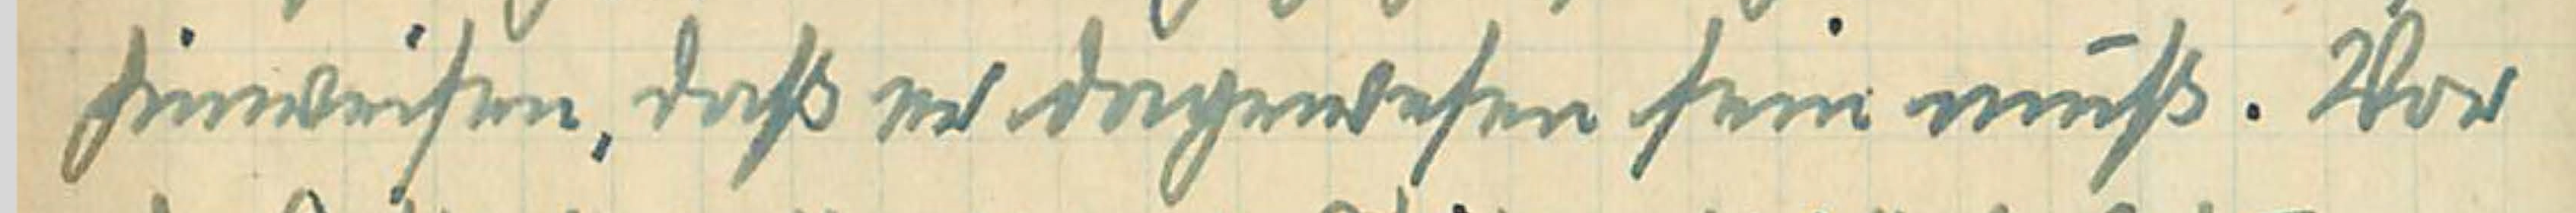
hinweisen, daß er dagewesen sein muß. Vor
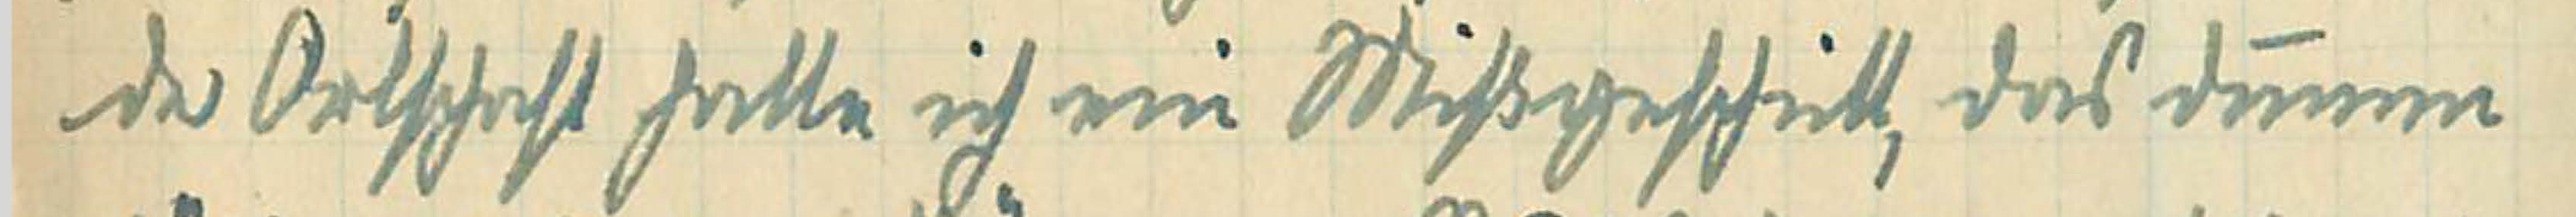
der Ortschaft hatte ich ein Mißgeschick, das dumm
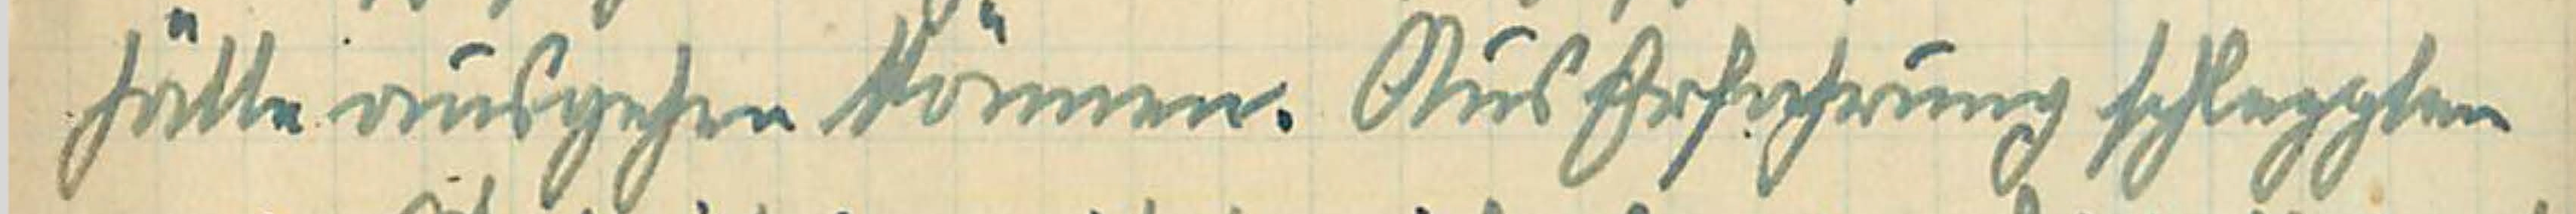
hätte ausgehen können. Aus Erfahrung schleppten
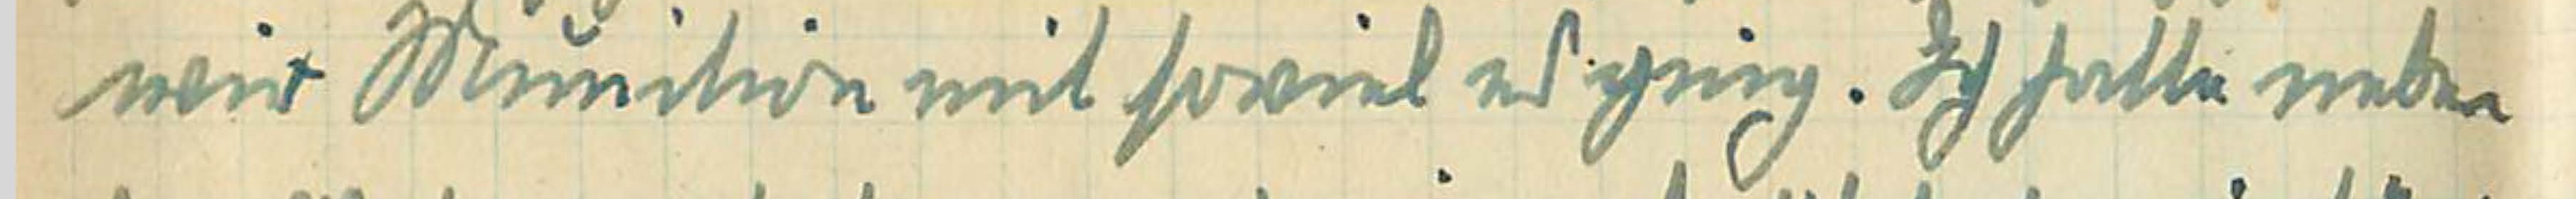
wir Munition mit soviel es ging. Ich hatte neben
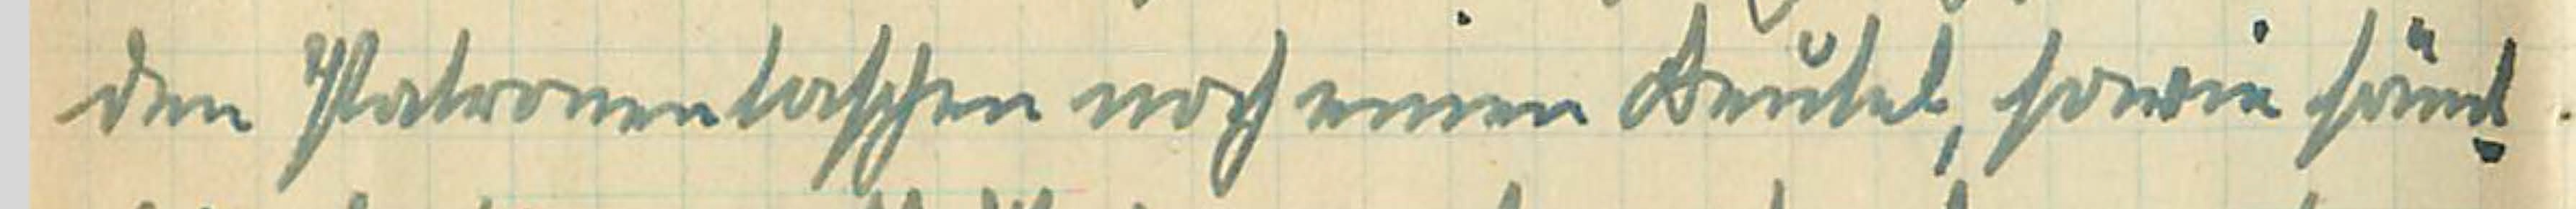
den Patronentaschen noch einen Beutel, sowie sämt-
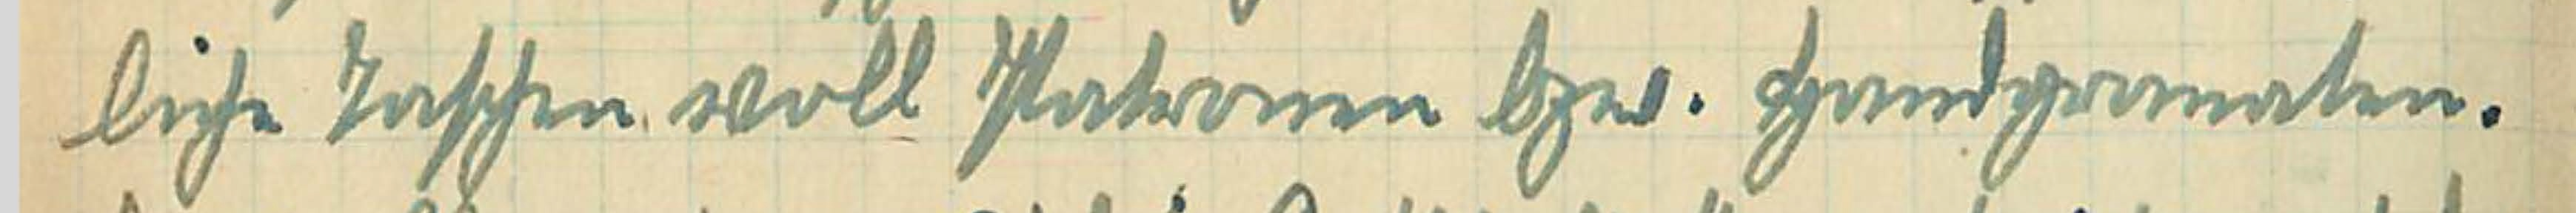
liche Taschen voll Patronen bzw. Handgranaten.
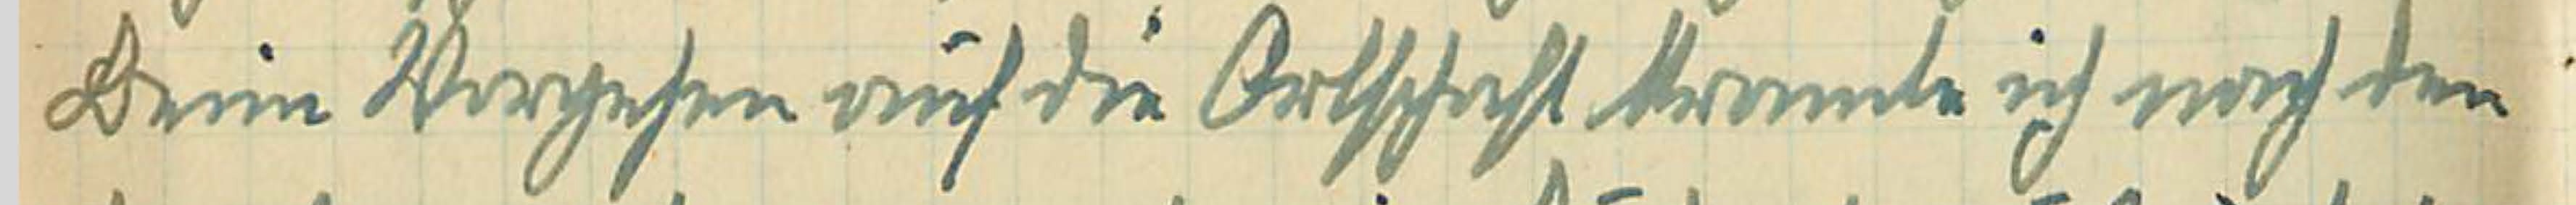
Beim Vorgehen auf die Ortschaft kramte ich nach den
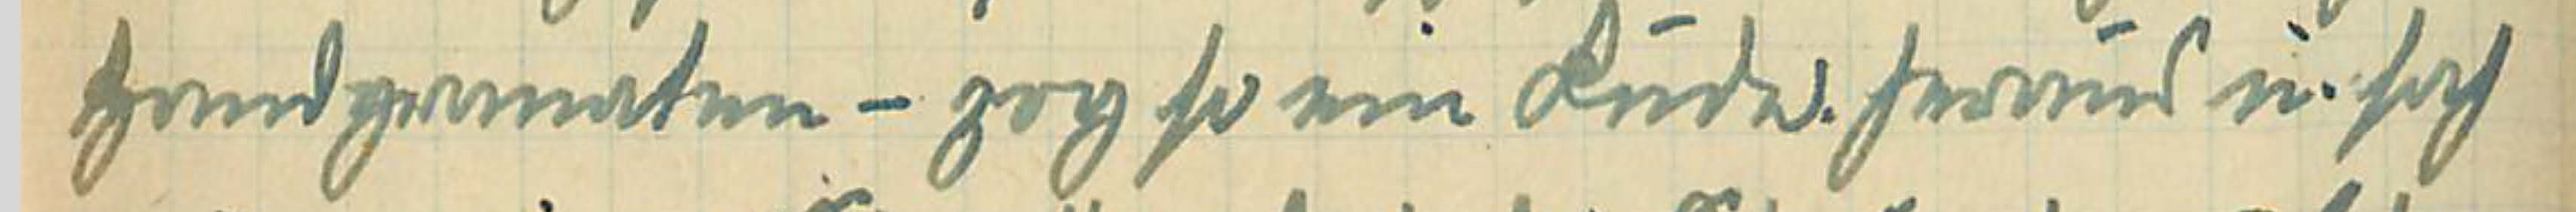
Handgranaten – zog so ein Luder heraus u. sah
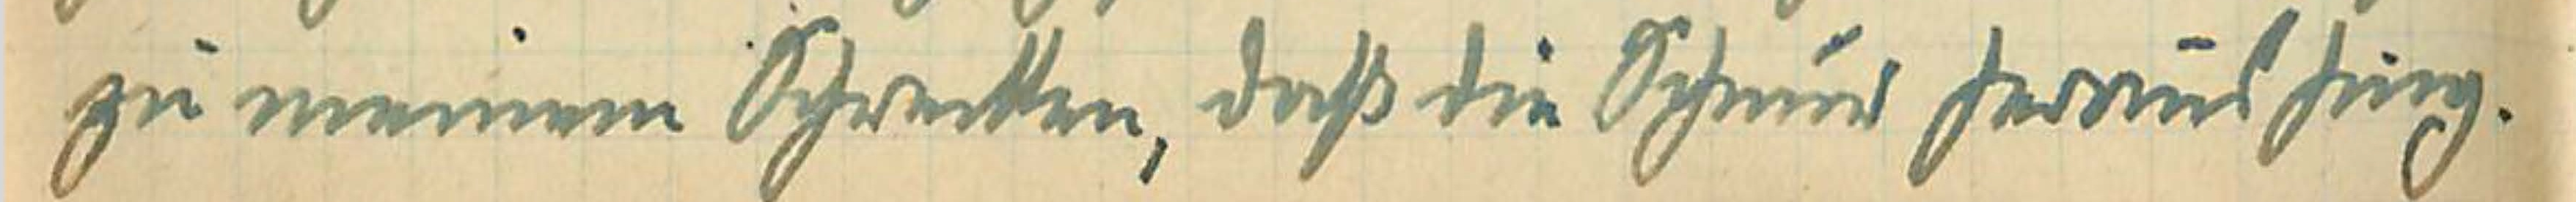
zu meinem Schrecken, daß die Schnur heraushing.
